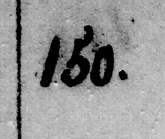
1833.
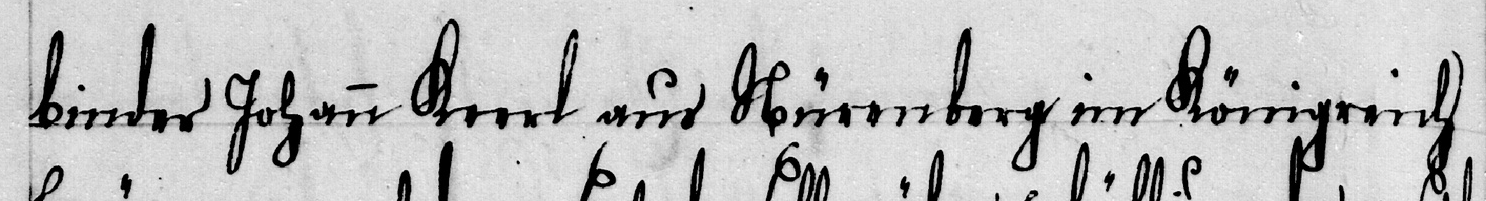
binder Johann Keerl aus Nürenberg [sic!] im Königreich
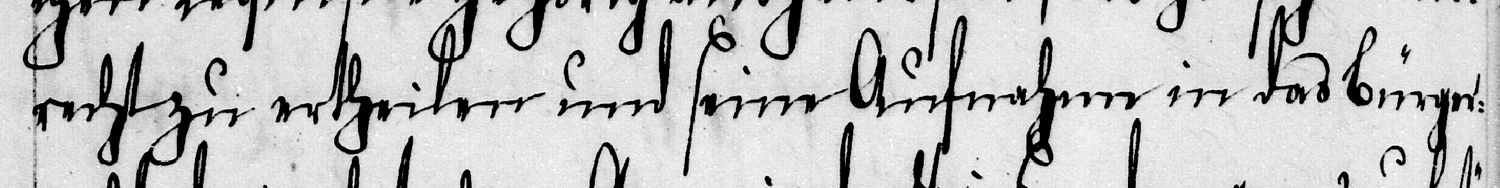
recht zu ertheilen und seine Aufnahme in das Bürger¬
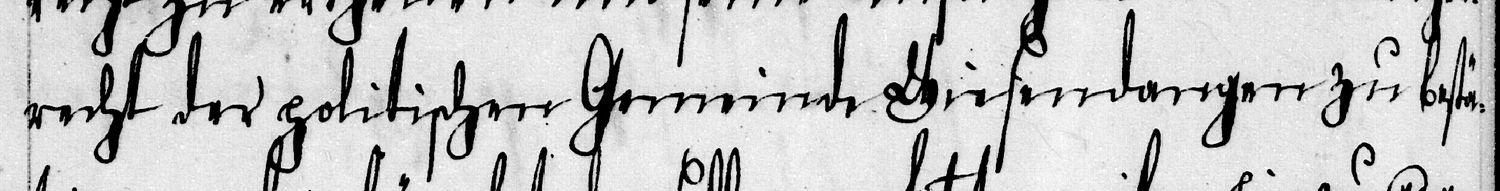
recht der politischen Gemeinde Wiesendangen zu best¬
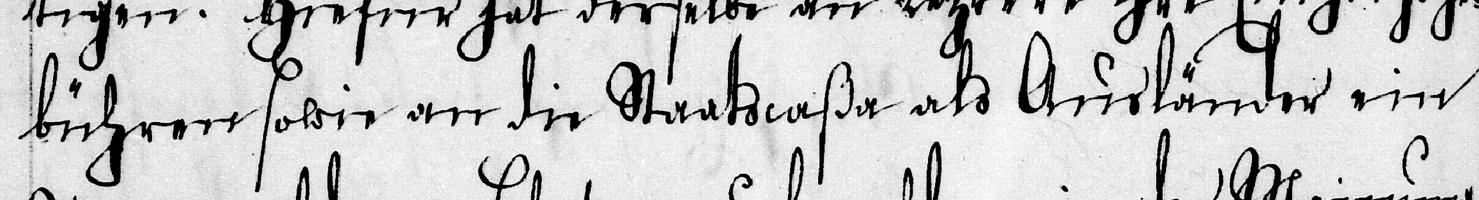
bühren sowie an die Staatscaßa als Ausländer ein
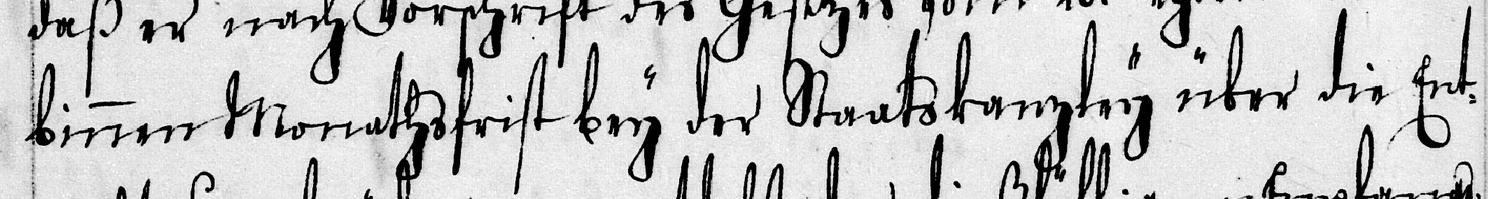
binnen Monathsfrist bey der Staatskanzley über die Ent¬
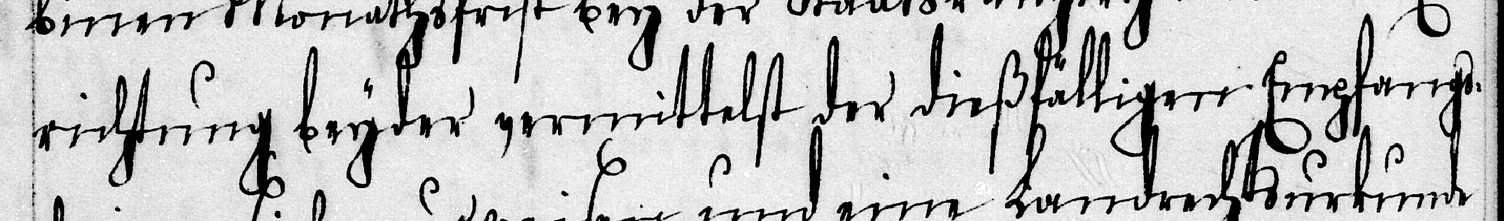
richtung beyder vermittelst der dießfälligen Empfangs¬
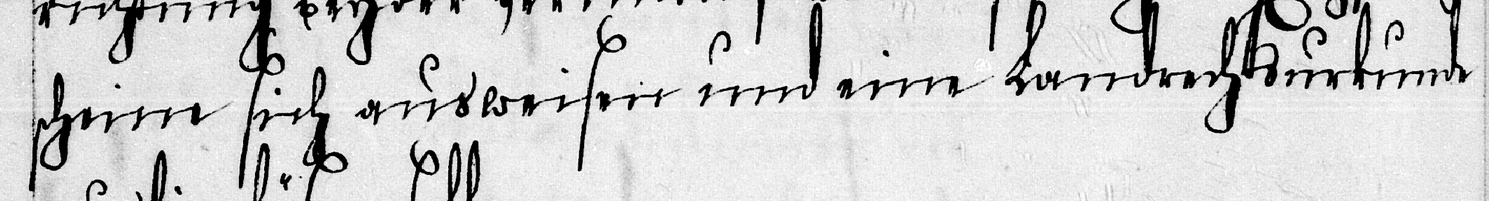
scheine sich ausweisen und eine Landrechtsurkunde
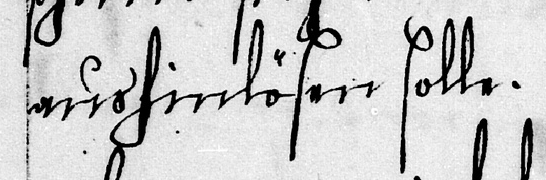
aushinlösen solle.
